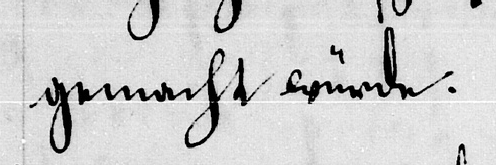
gemacht würde.
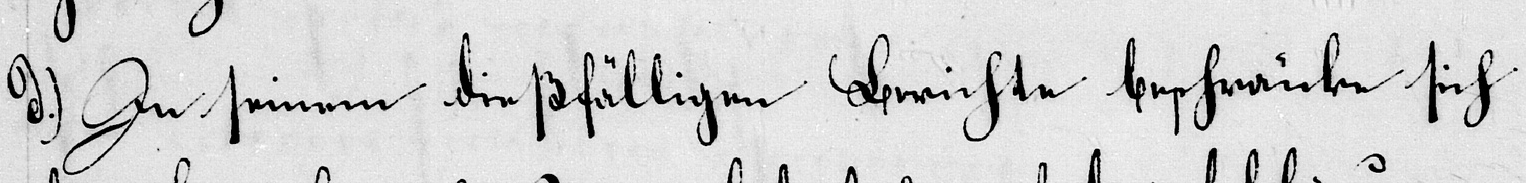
d.) In seinem dießfälligen Berichte beschränke sich
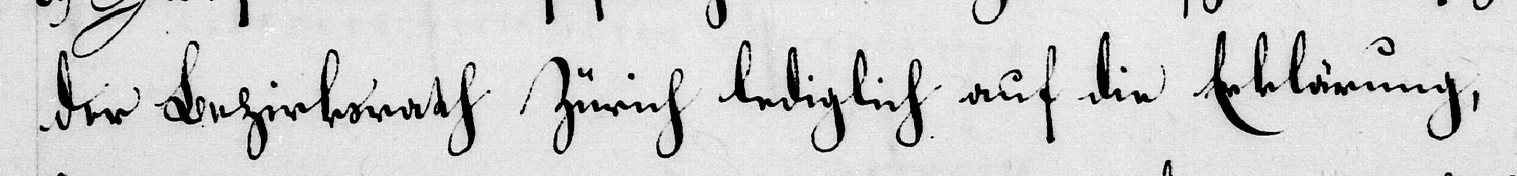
der Bezirksrath Zürich lediglich auf die Erklärung,
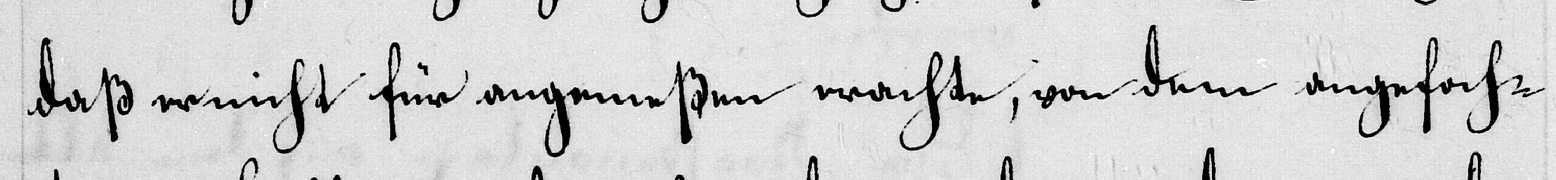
daß er nicht für angemeßen erachte, von dem angefoch¬
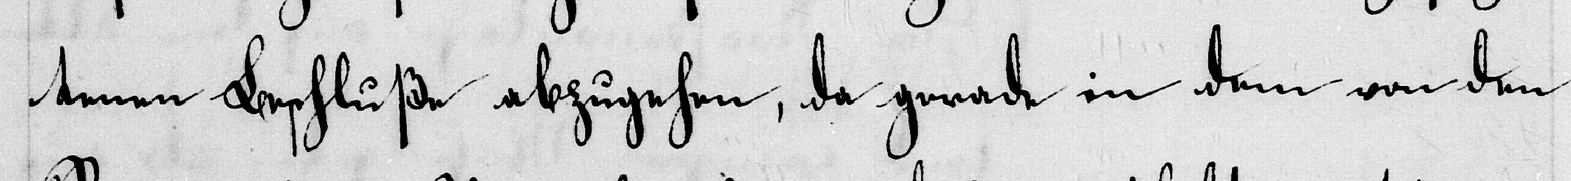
tenen Beschluße abzugehen, da gerade in dem von den
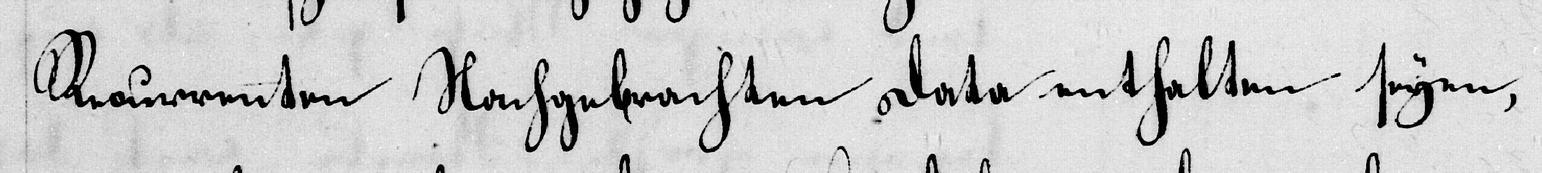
Recurrenten Nachgebrachten Data enthalten seyen,
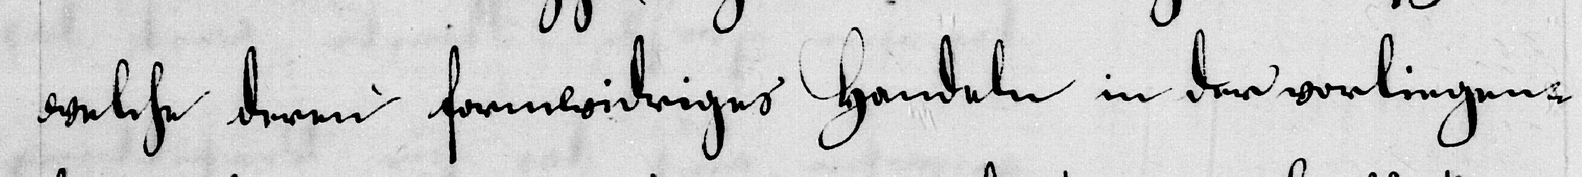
welche deren formwidriges Handeln in der vorliegen¬
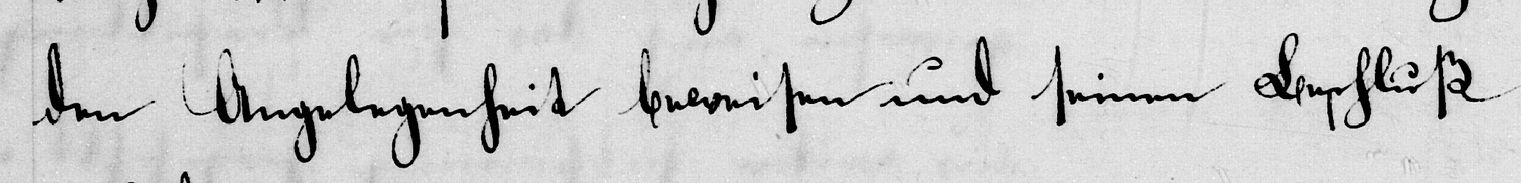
den Angelegenheit beweisen und seinen Beschluß
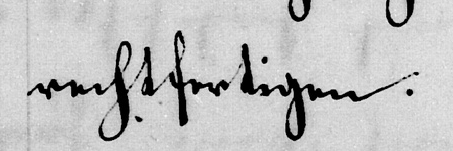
rechtfertigen.
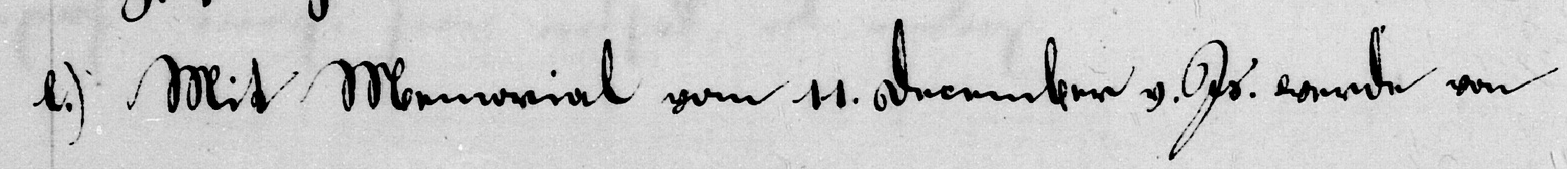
e.) Mit Memorial vom 11. December v. Js. wurde von
